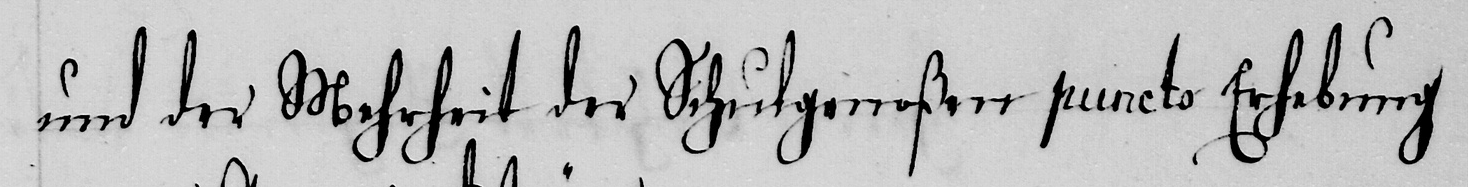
und der Mehrheit der Schulgenoßen puncto Erhebung
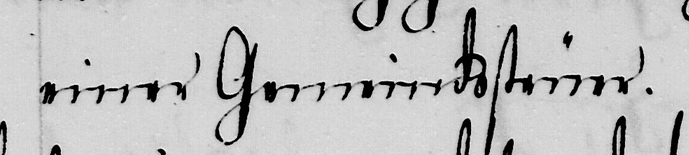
einer Gemeindssteuer.
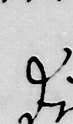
b.)
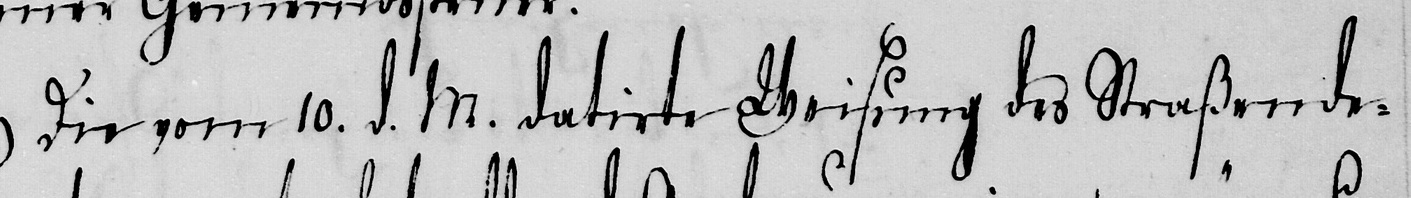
Die vom 10. d. M. datirte Weisung des Straßende¬
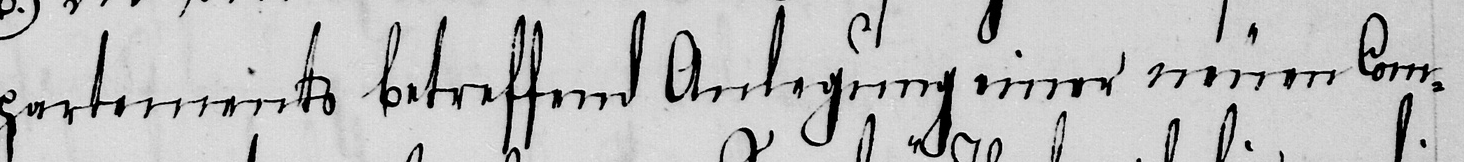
partements betreffend Anlegung einer neuen Com¬
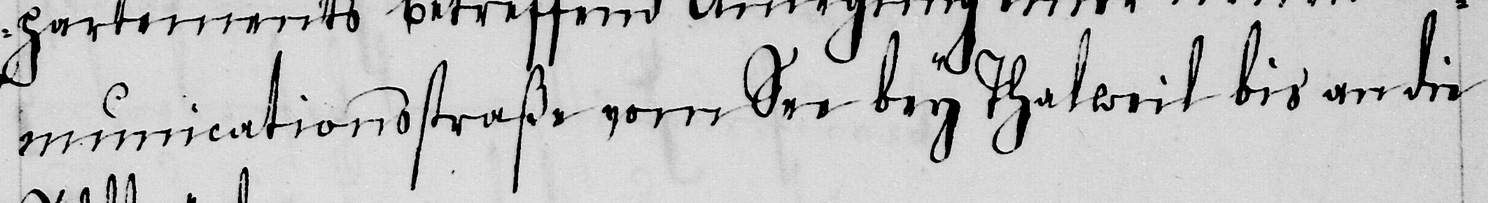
municationsstraße vom See bey Thalweil bis an die
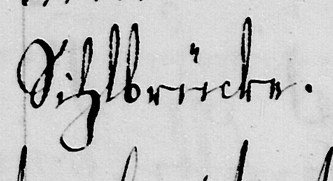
Sihlbrücke.
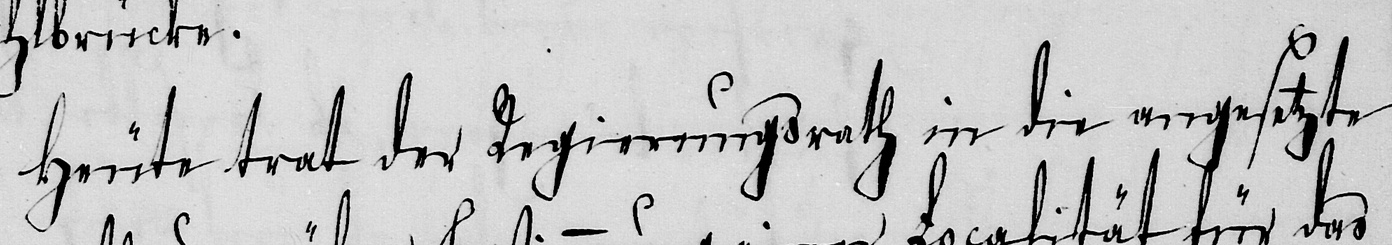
Heute trat der Regierungsrath in die angesetzte
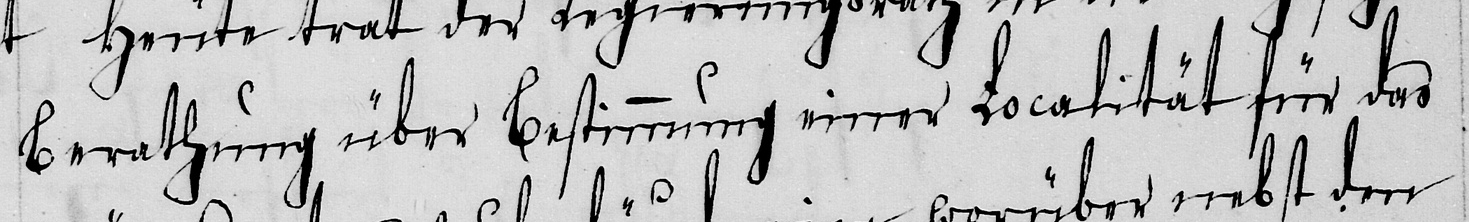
Berathung über Bestimmung einer Localität für das
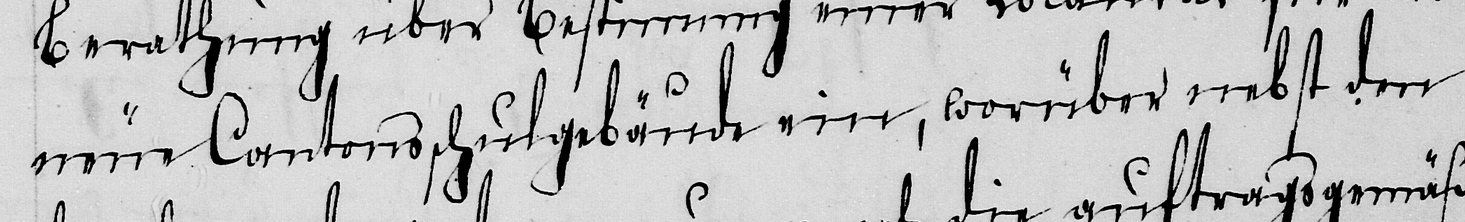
neue Cantonsschulgebäude ein, worüber nebst den
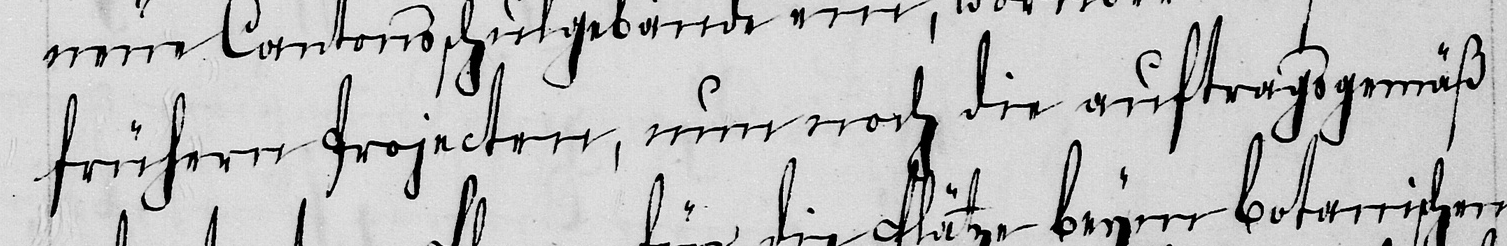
frühern Projecten, nun noch die auftragsgemäß
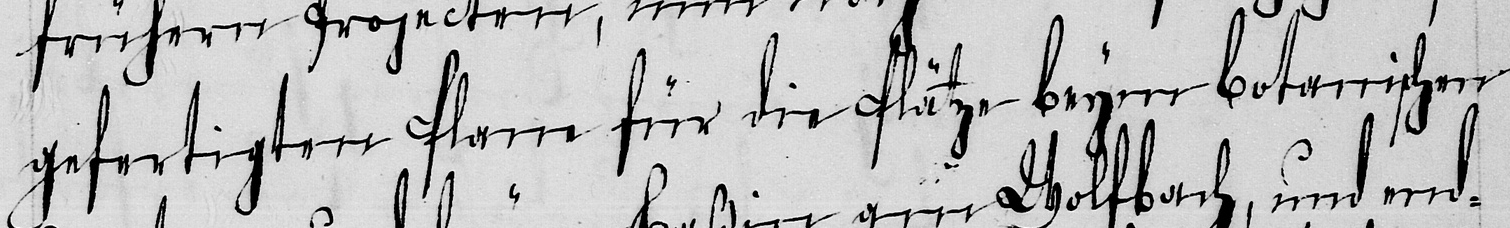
gefertigten Plane für die Plätze beym botanischen
